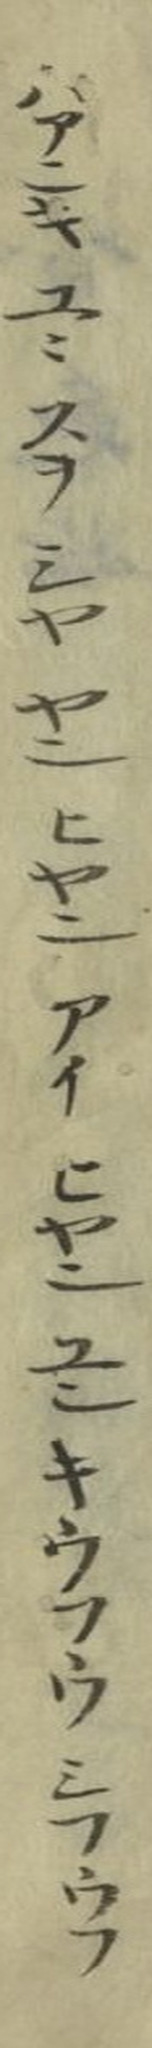ハアンキユヽスヲシヤヤンヒヤンアイヒヤンユンキウフウシフウフ
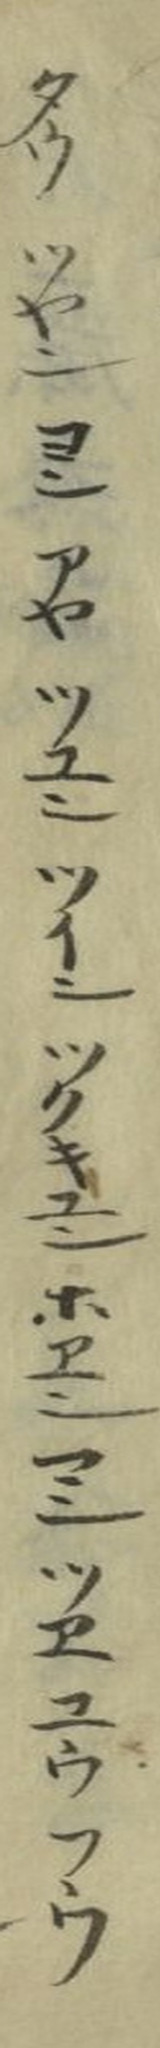タウツヤンヨンアヤツュンツインツクキユンホエンマンツエユウフウ
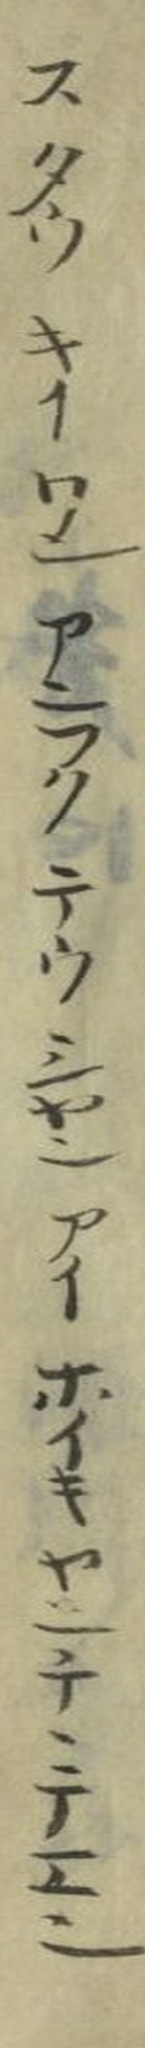スタウキイワンアンフクテウシヤンアイホイキヤンチヽテエン
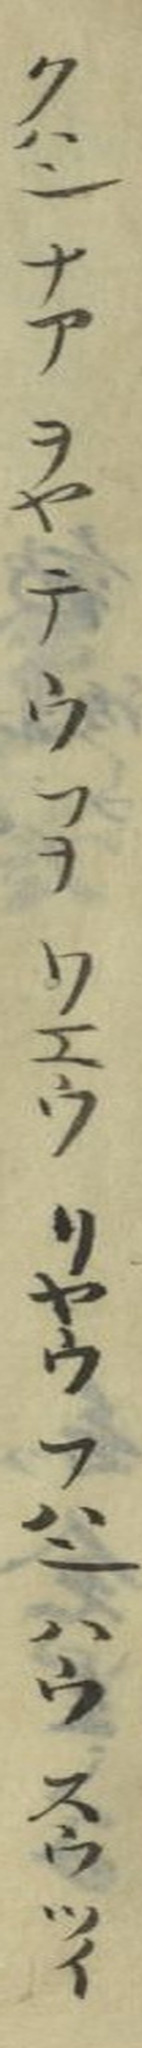クハンナアヲヤテウフヲワエウリヤウフハンハウスウツイ
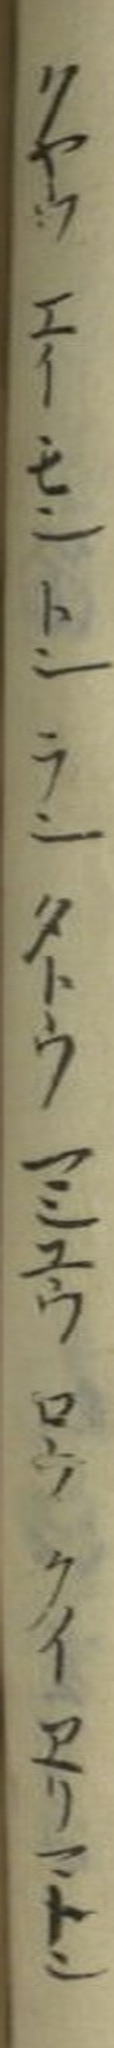クヤウエイモントンテンタトウマンユウロウクイエリマトン
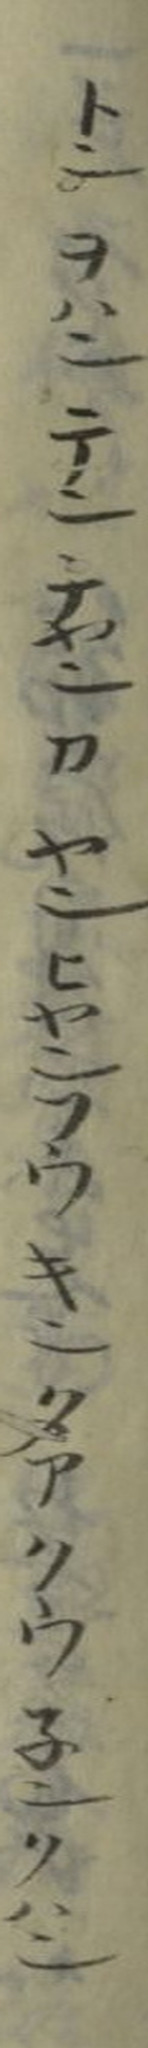トンヲハンテンチヤンカヤンヒヤンフウキンタアクウネンクハン
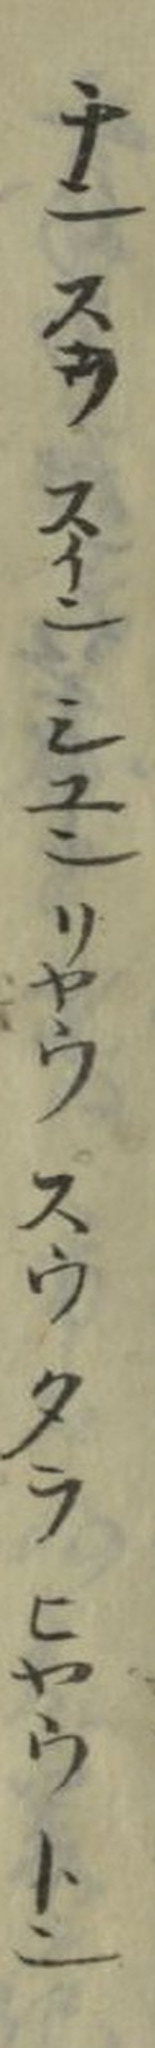チンスヲスインシユンリヤウスウタラヒヤウトン
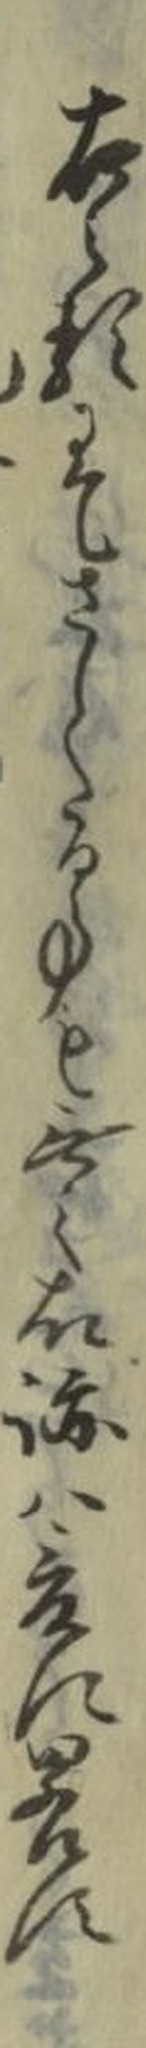右の類にてさしたる事も無之故跡は爰に略す
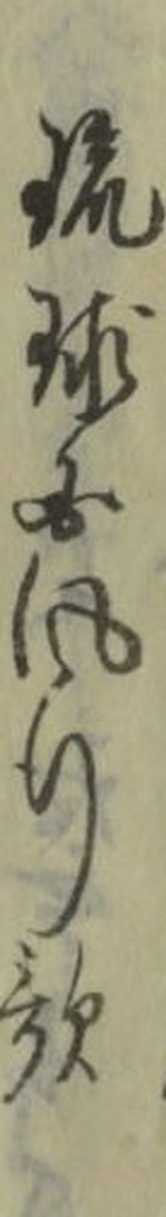琉球国風行歌
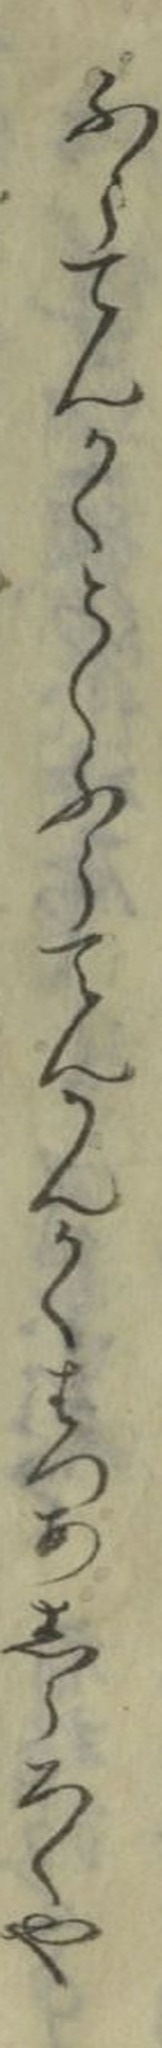ふうてんかくとくふうてんかんかくはつあしろくや
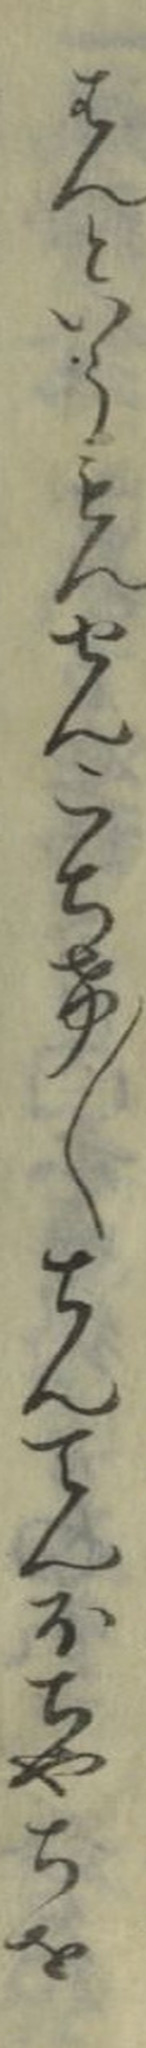はんというもんせんこちけ〳〵ちんてんほちやちを
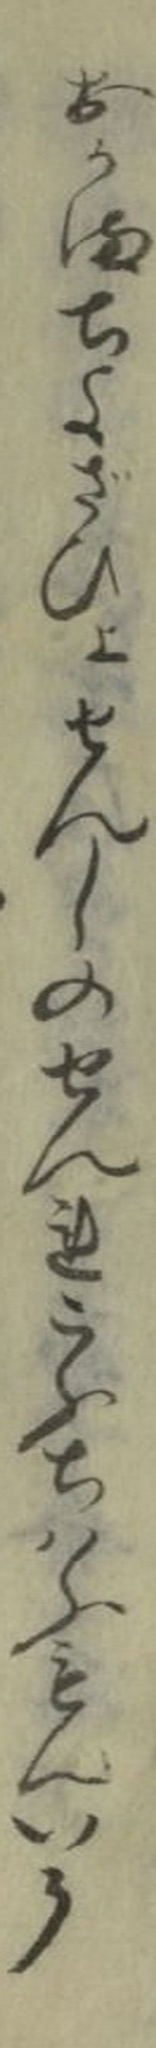おかまちよざひ上せんしのせんれこふちはふもんいう
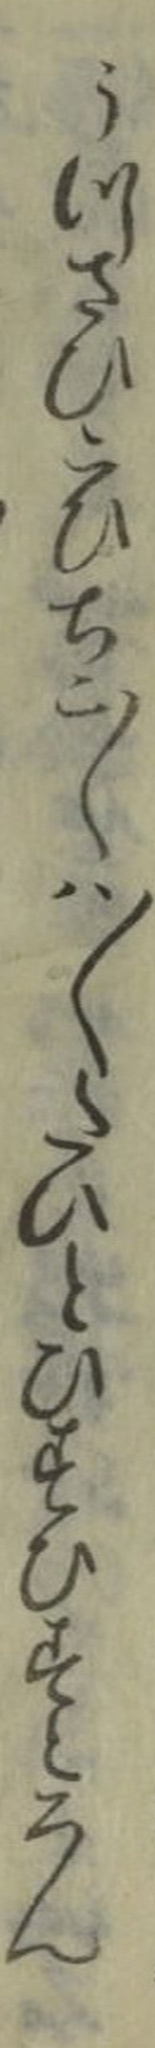うつさひこひちこ〳〵は〳〵たひとひすひすとうん
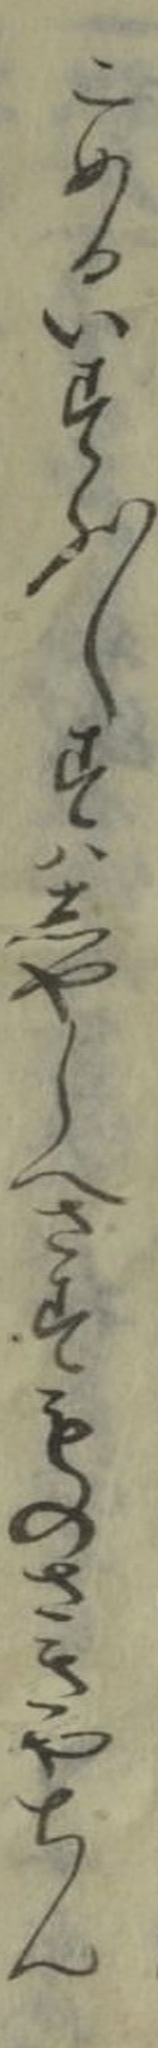こめるいすふ〳〵すはしやしへさすものさきやちん
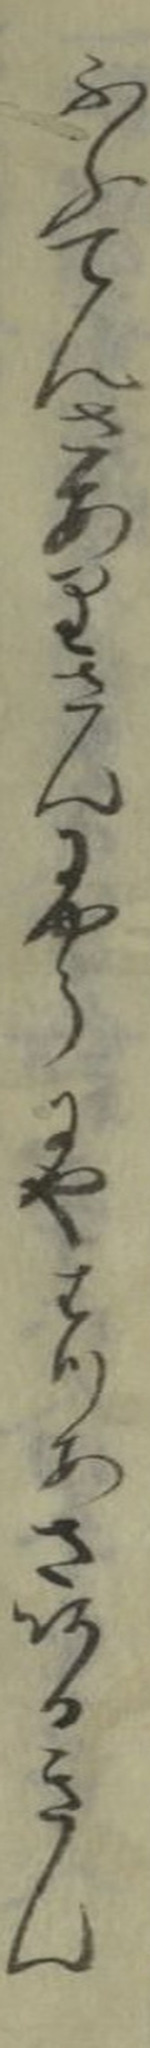ふふてんさありさんにやうにやはつあさあるきん
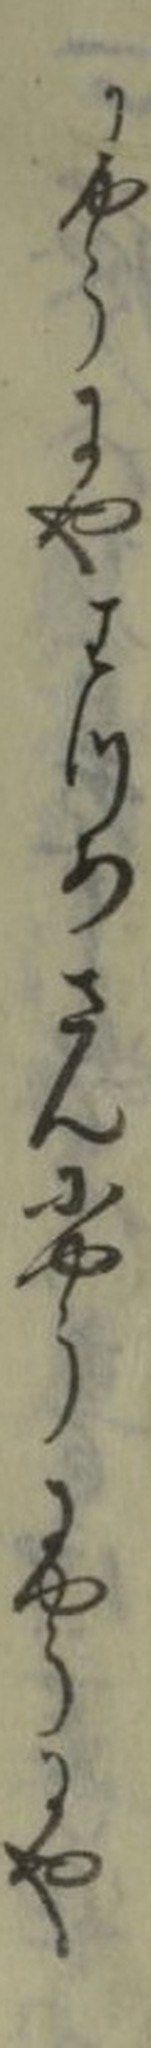にやうにやはつあさんにやうにやうにや
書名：琉球人来朝之記
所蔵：University of the Ryukyus Library
